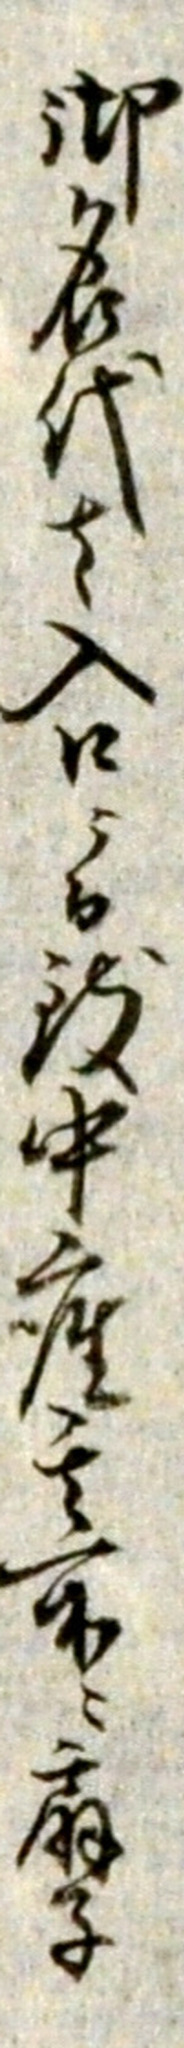御名代者入口ニ而致中座其所ニ扇子
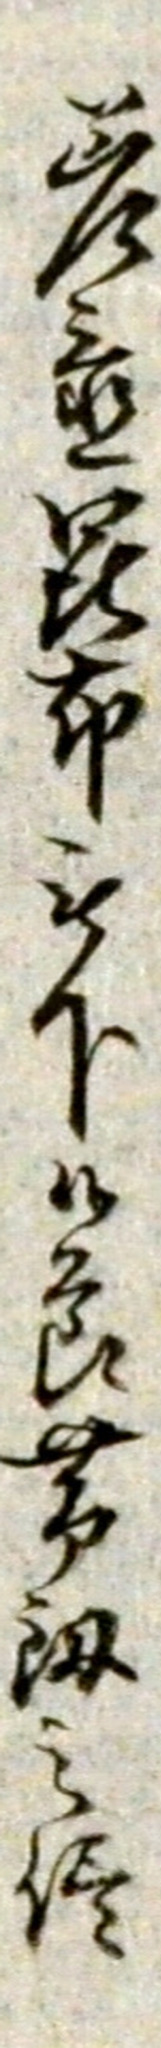差置昆布被下候節帯剣之侭
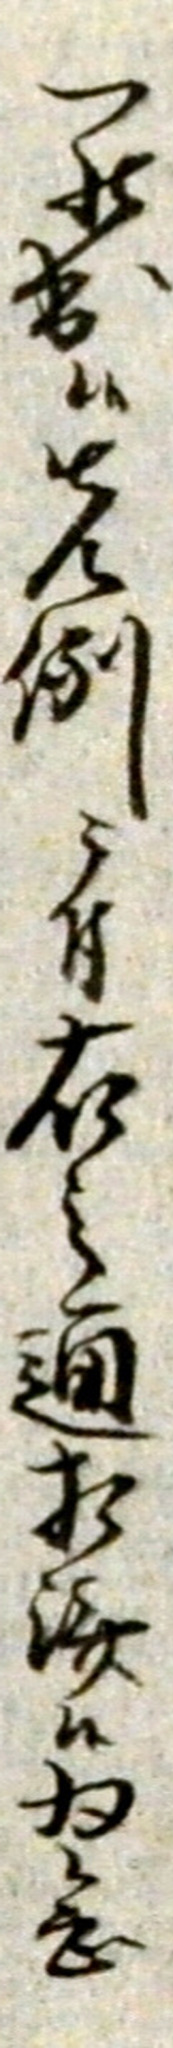罷出候先例ニ付右之通相済候為念
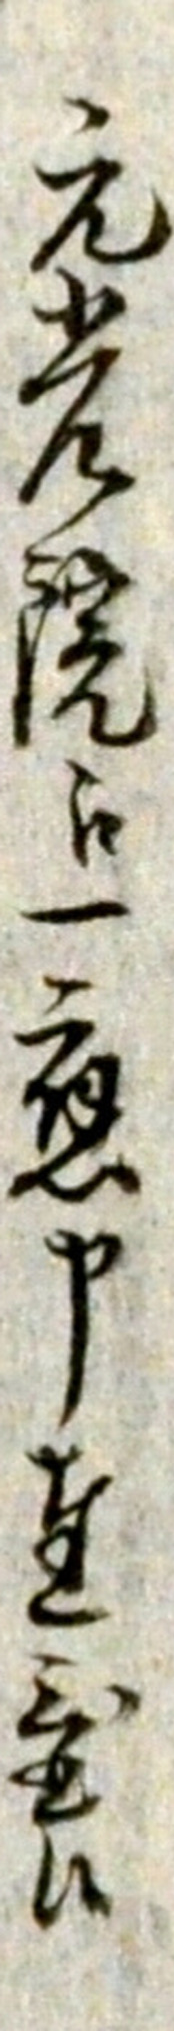元光院江一応申達置候
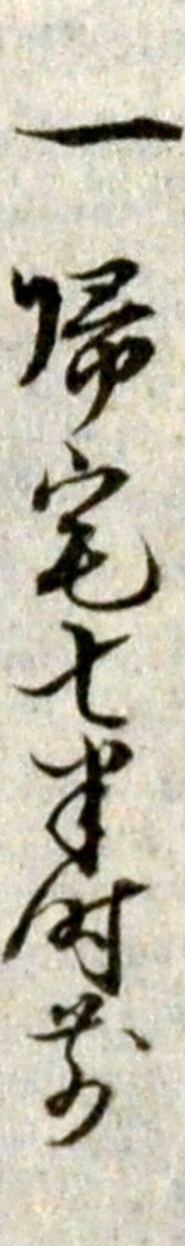一帰宅七半時前
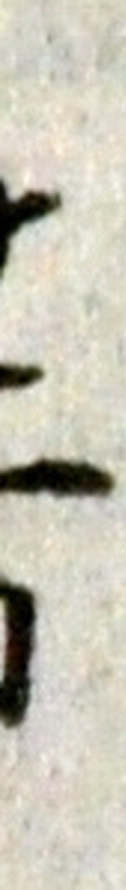十二日

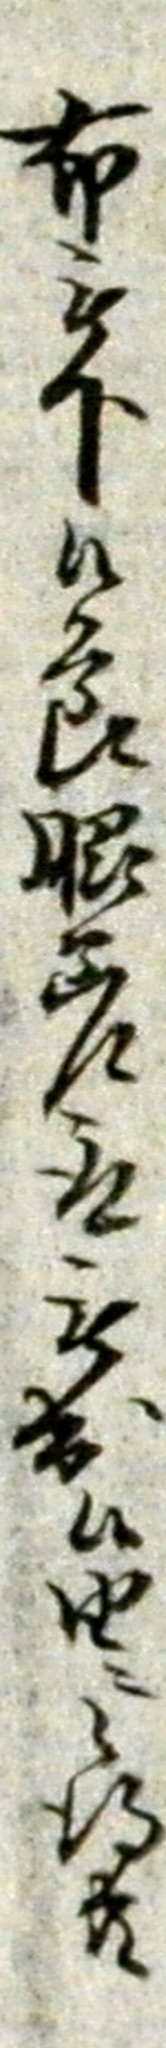布被下候節脇差取被出候由ニ候得共
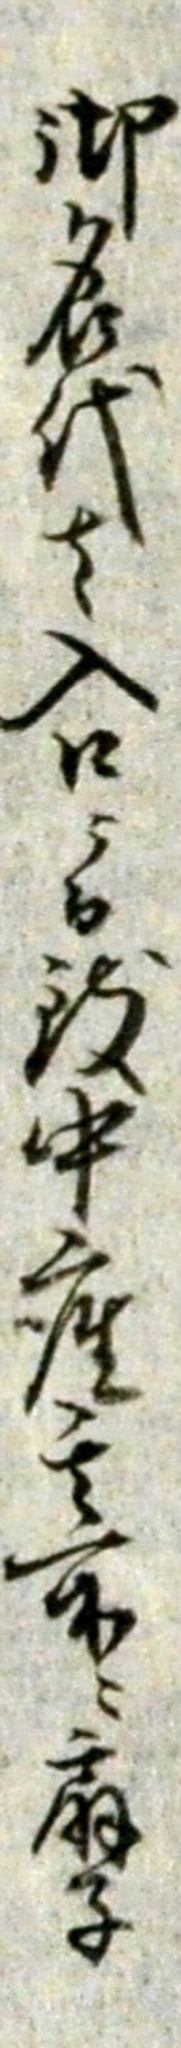御名代者入口二而致中座其所ニ扇子
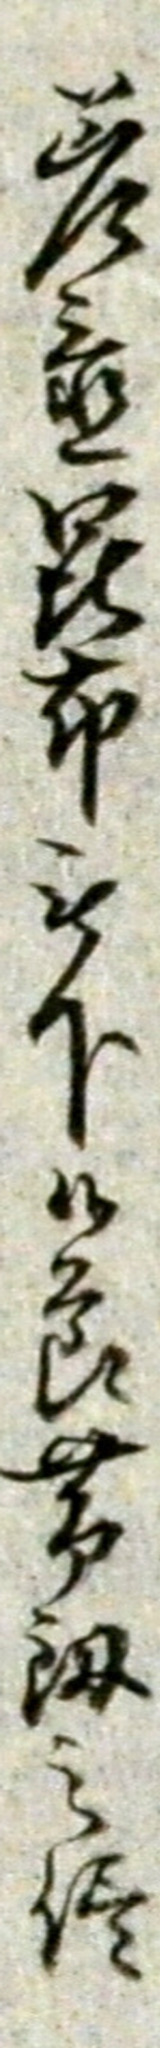差置昆布被下候節帯剣之侭
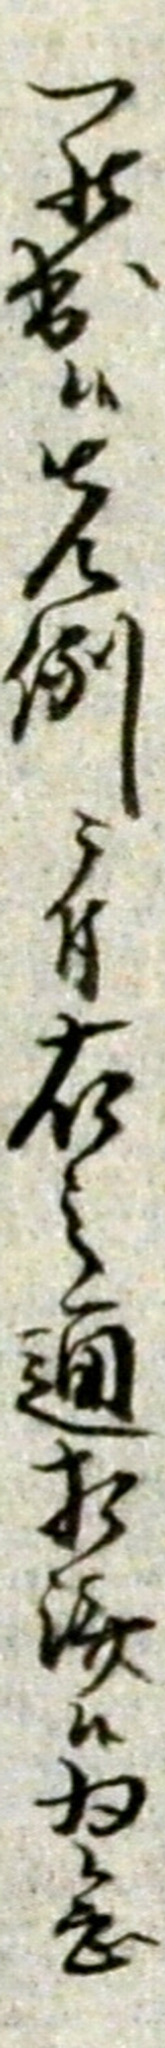罷出候先例ニ付右之通相済候為念
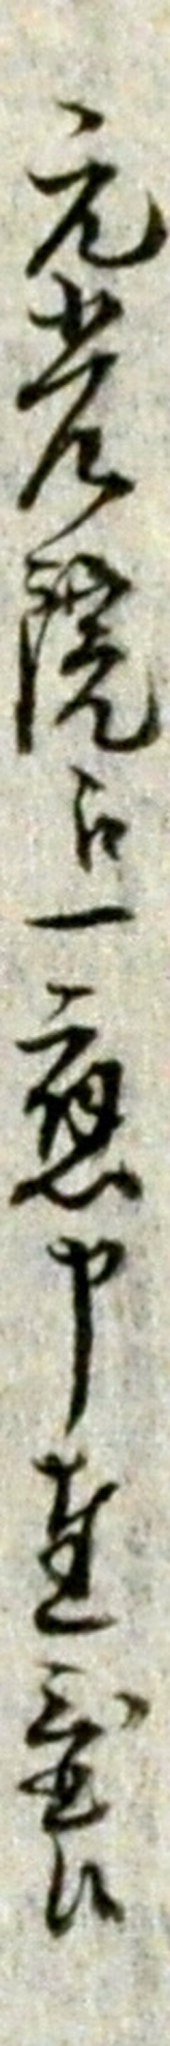元光院江一応申達置候
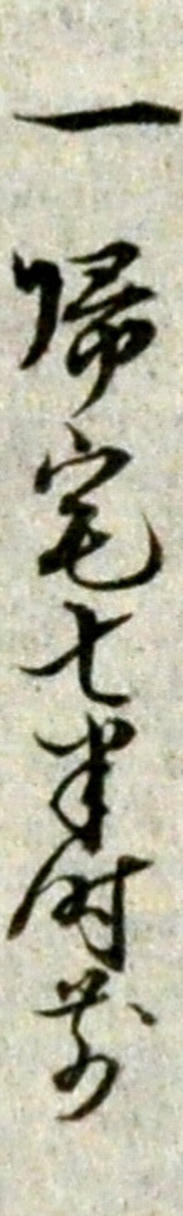一帰宅七半時前
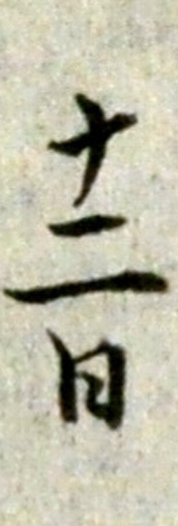十二日
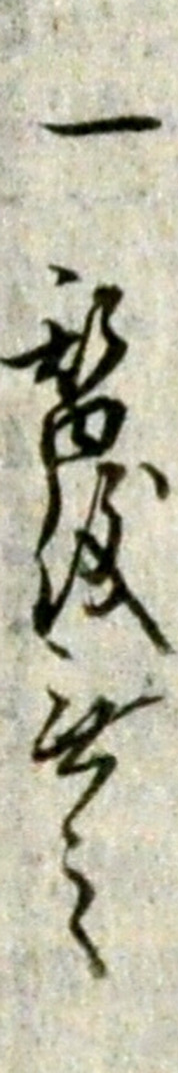一替儀無之
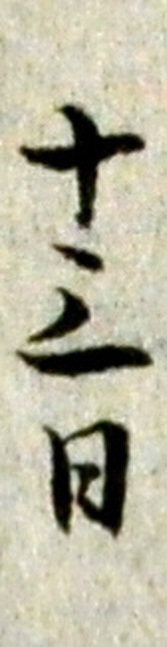十三日
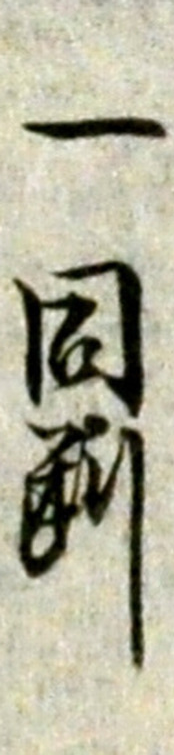一同断
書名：日光御名代相勤候節ノ留
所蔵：伊那市立高遠町図書館・合同会社AMANE
